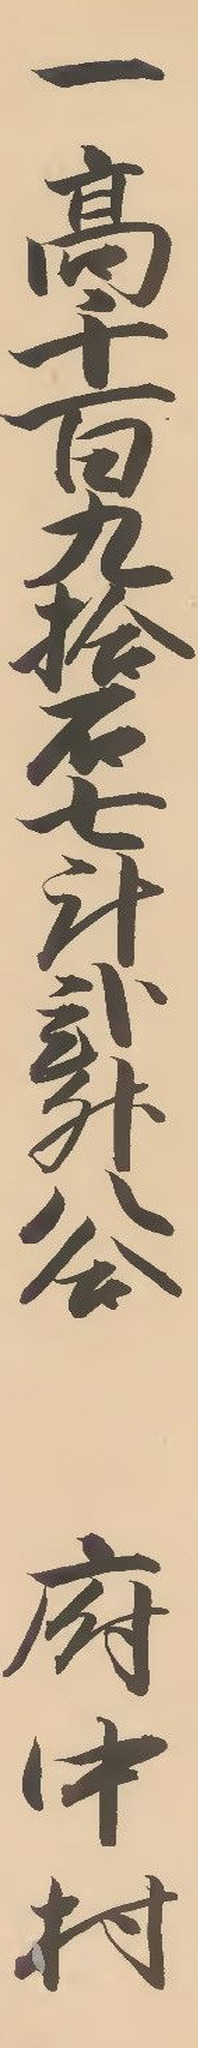一高千百九拾石七斗弐升八合府中村
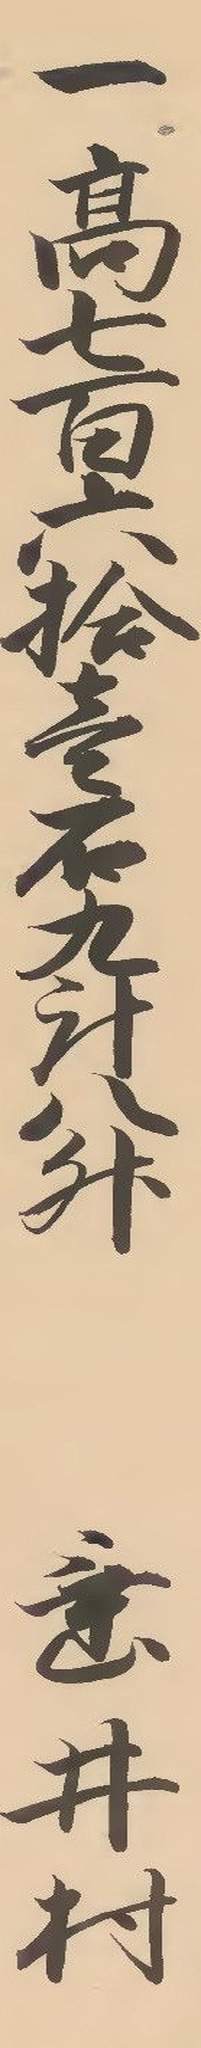一高七百六拾壱石九斗八升垂井村

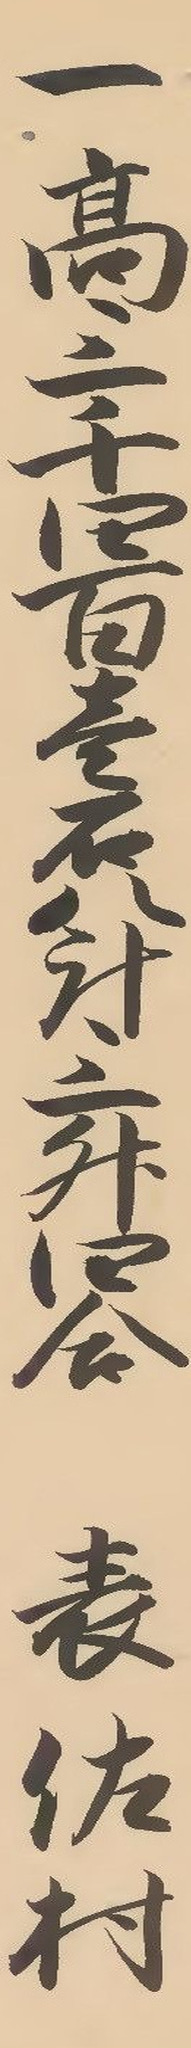一高三千四百壱石八斗三升四合表佐村
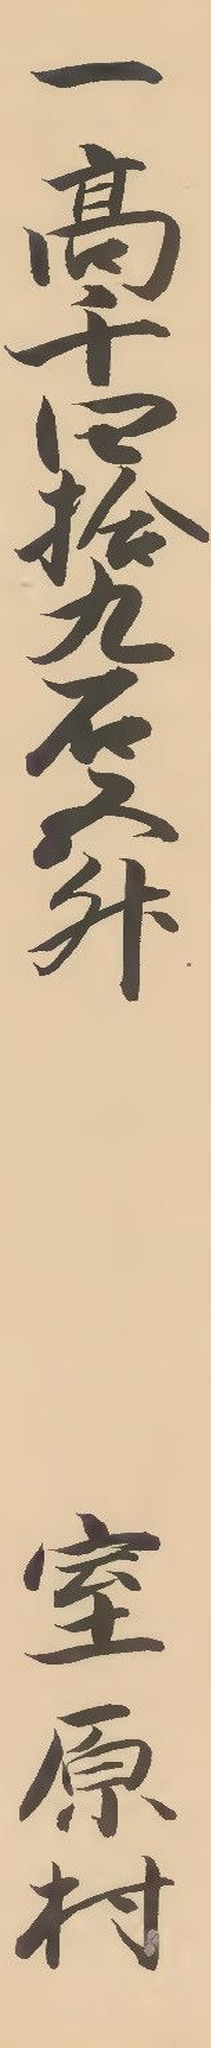一高千四拾九石五升室原村
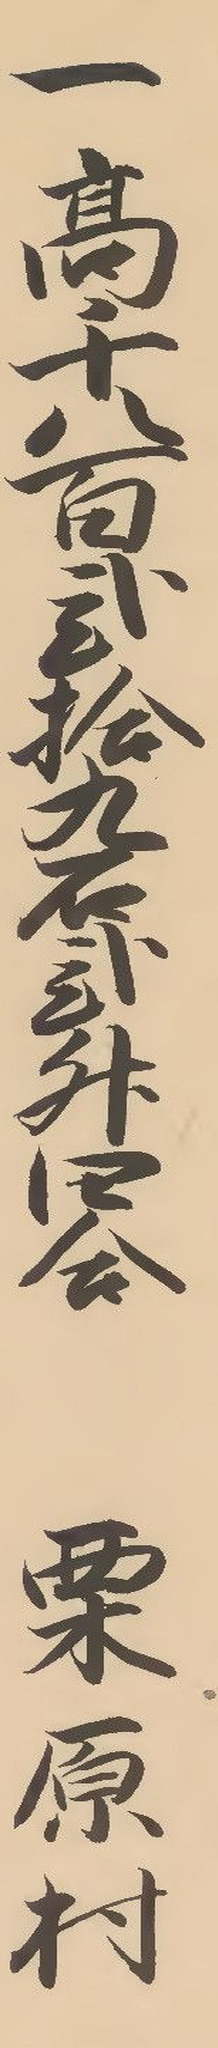一高千八百弐拾九石弐升四合栗原村
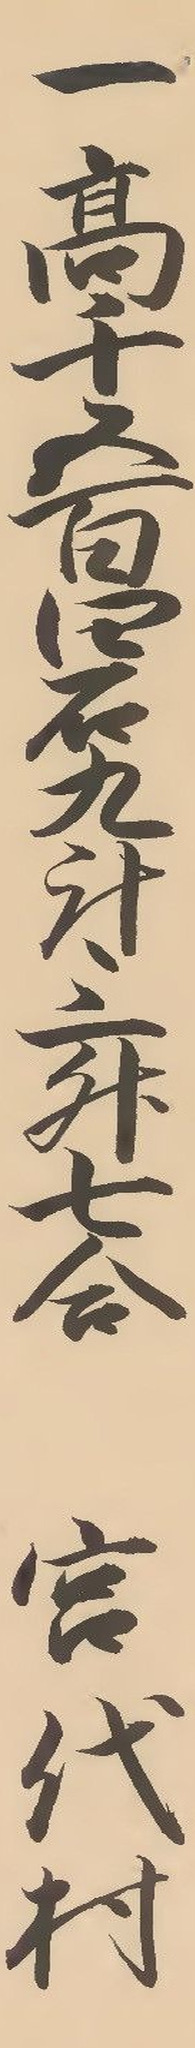一高千五百四石九斗三升七合宮代村
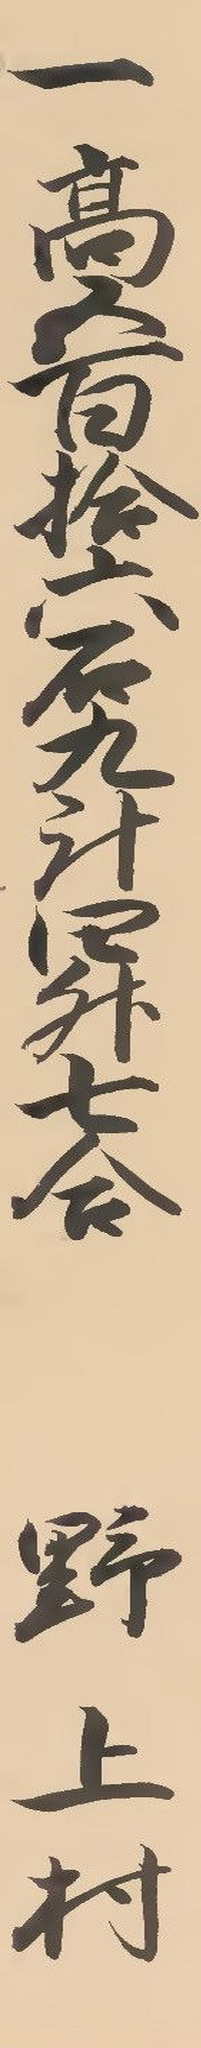一高五百拾六石九斗四升七合野上村
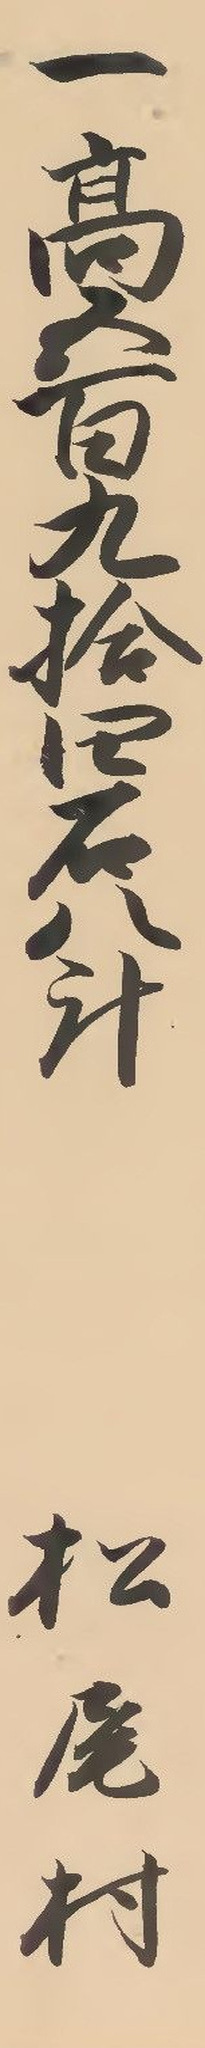一高五百九拾四石八斗松尾村

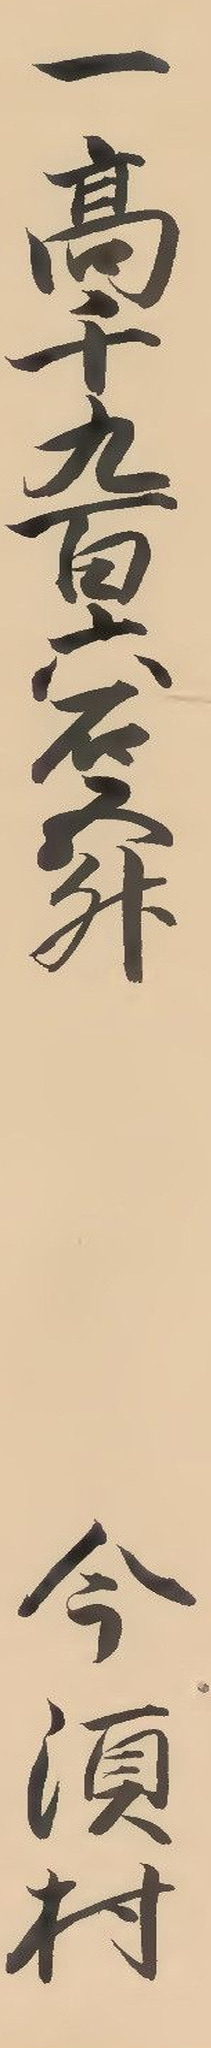一高千九百六石五升今須村
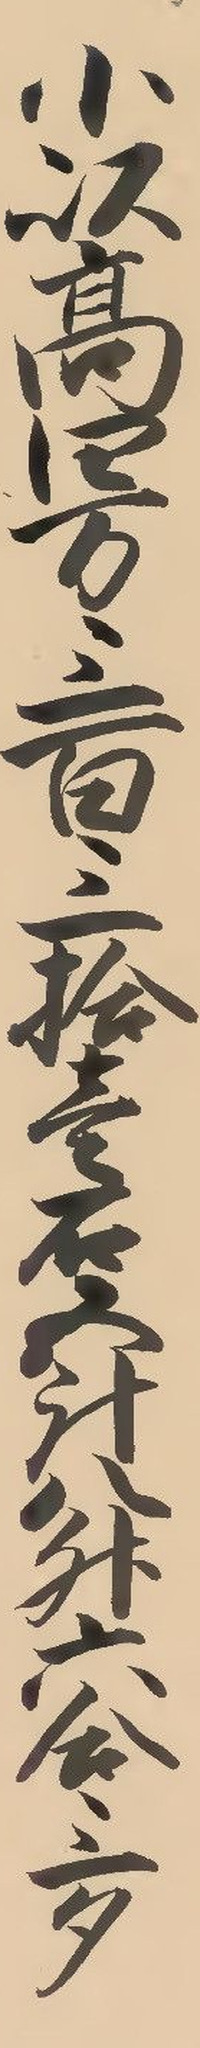小以高四万三百三拾壱石五斗八升六合三勺

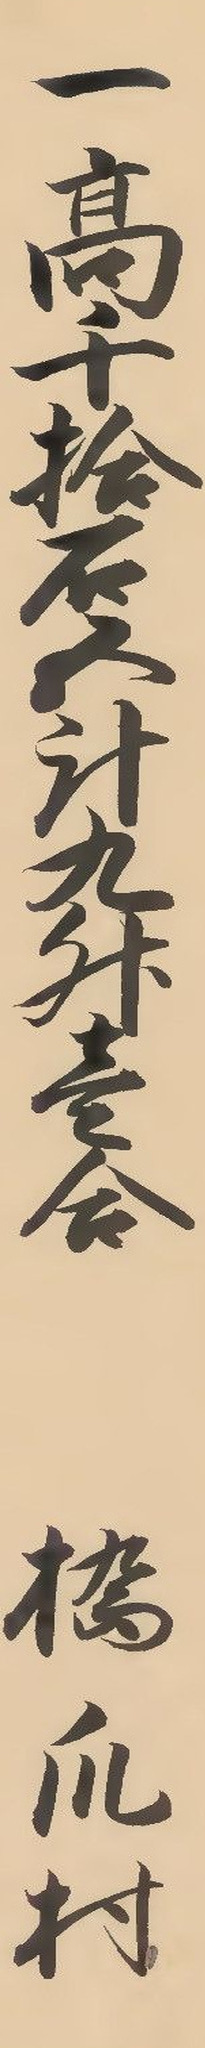一高千拾石五斗九升壱合橋爪村
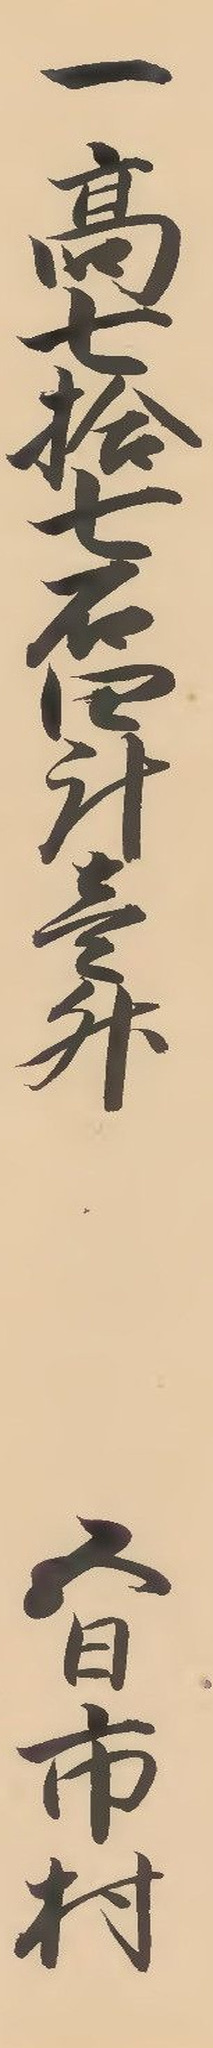一高七拾七石四斗壱升五日市村
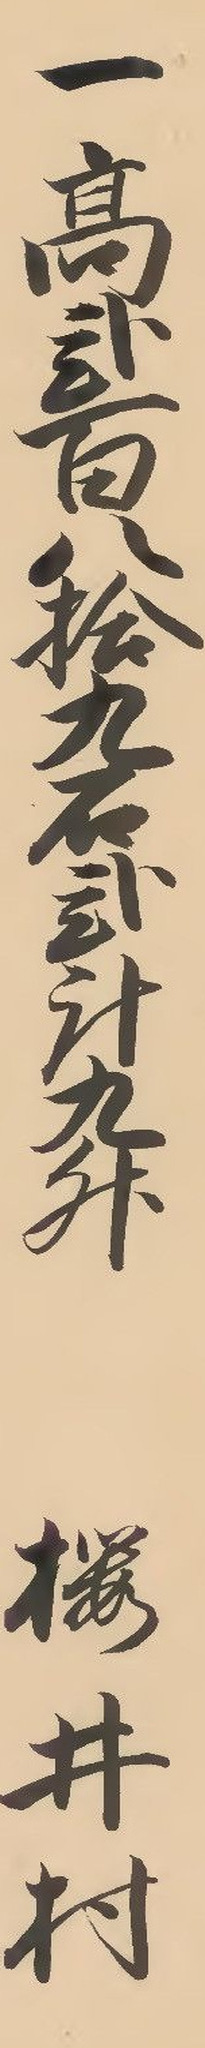一高弐百八拾九石弐斗九升桜井村
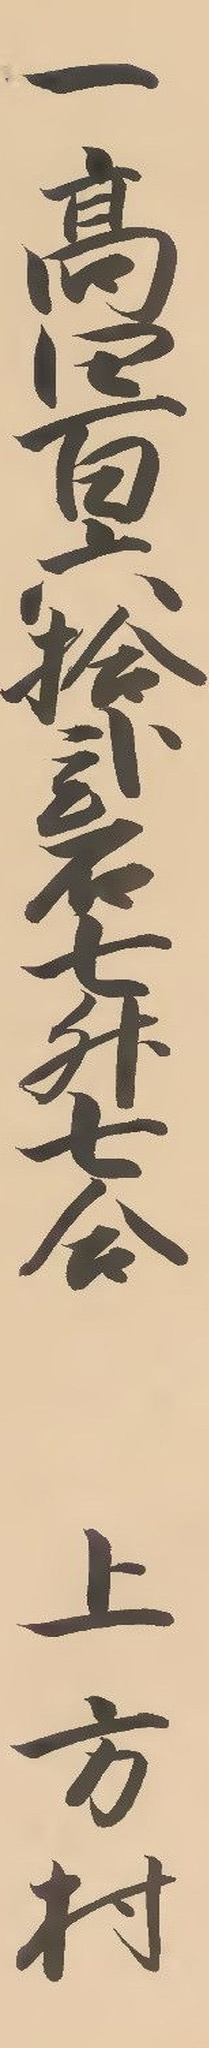一高四百六拾弐石七升七合上方村
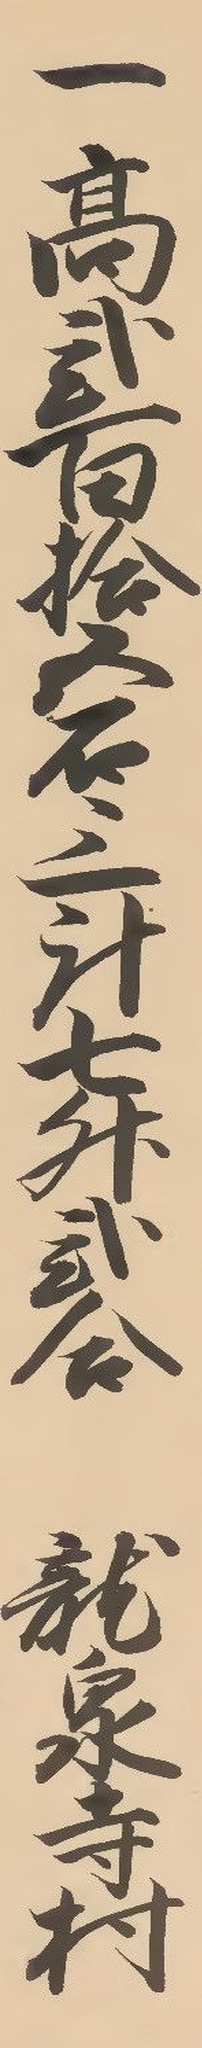一高弐百拾五石三斗七升弐合龍泉寺村
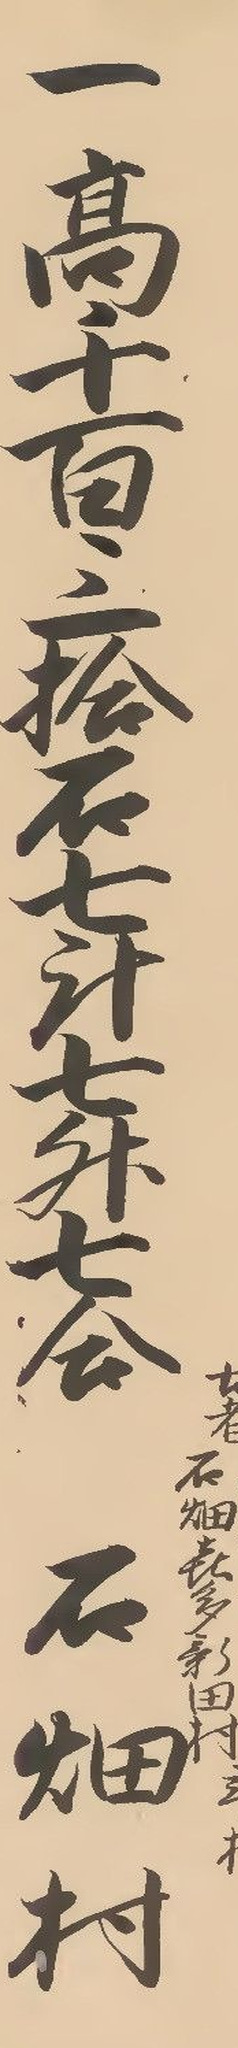一高千百三拾石七斗七升七合石畑村
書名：美濃国郷帳
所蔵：国立公文書館 National Archives of Japan
